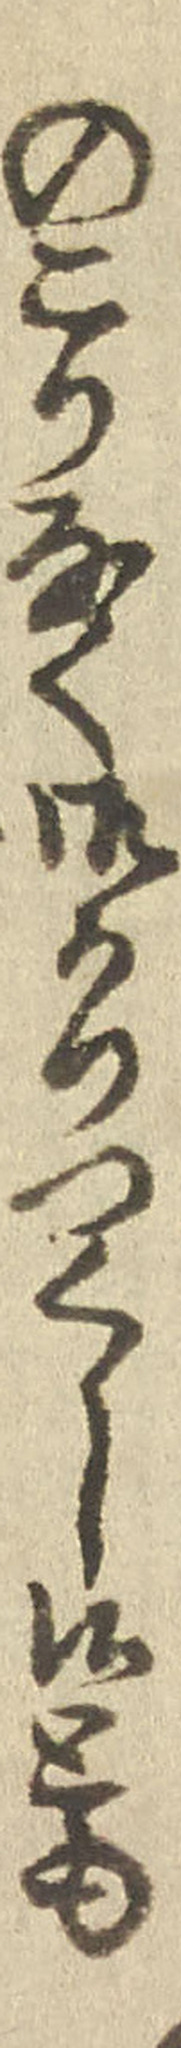のこりなく御かりつくし候とも
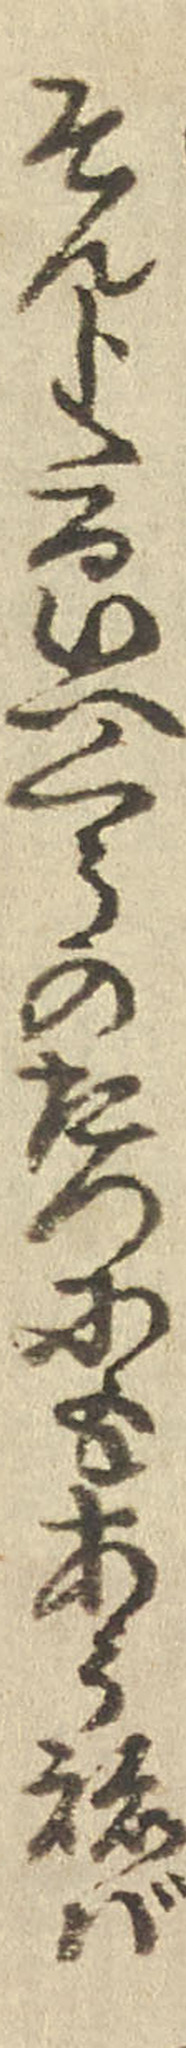そんじたるいへくらのたつにもあらねば
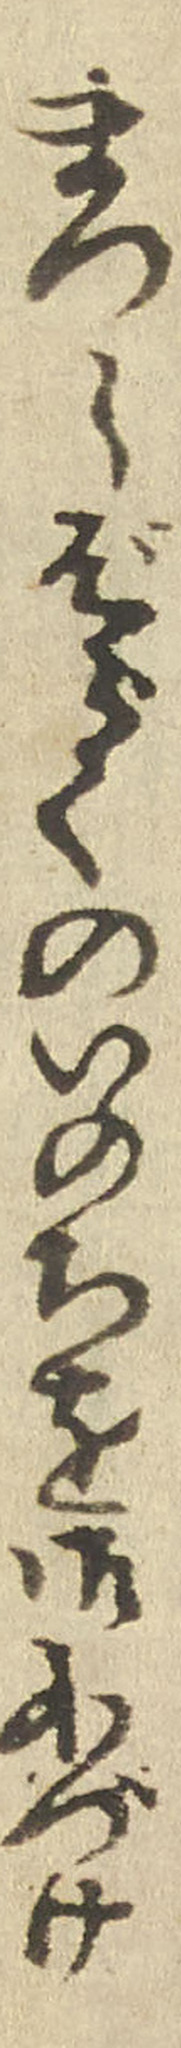まつしばらくのいのちを御あづけ
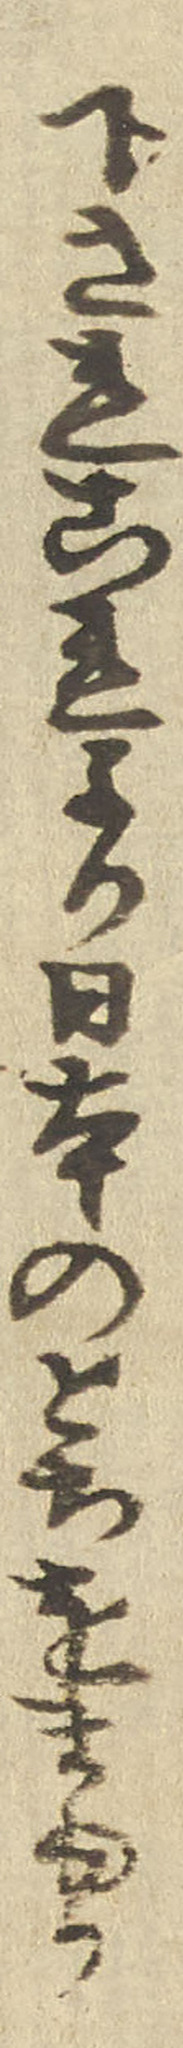下されこれより日本のとちをまもり
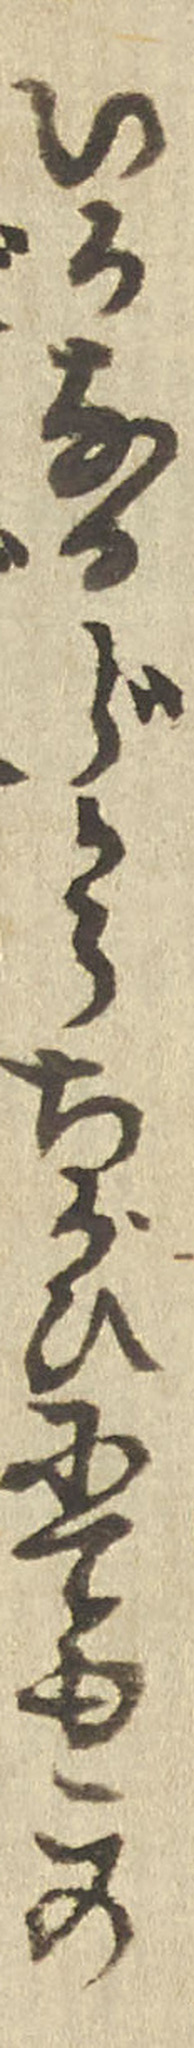いかなるじかうちがひにてもこの
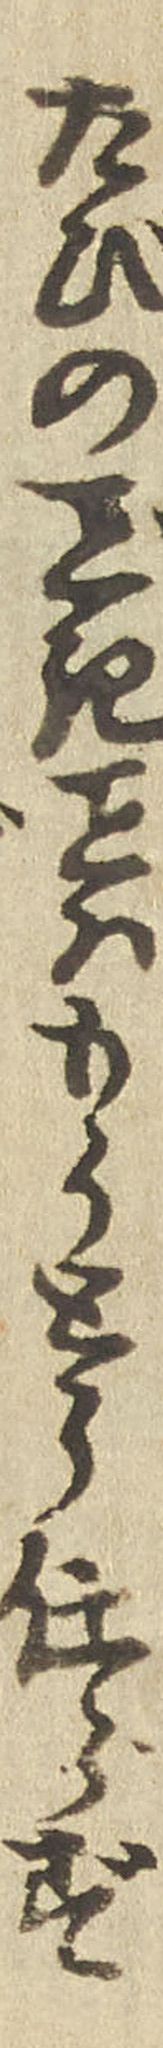たびのごときことはもうとう仕らず
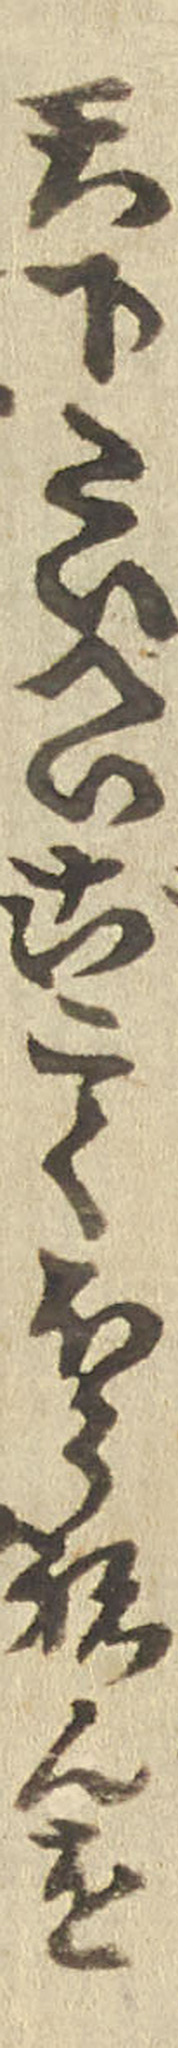天下のたいへいごこくほうねんを
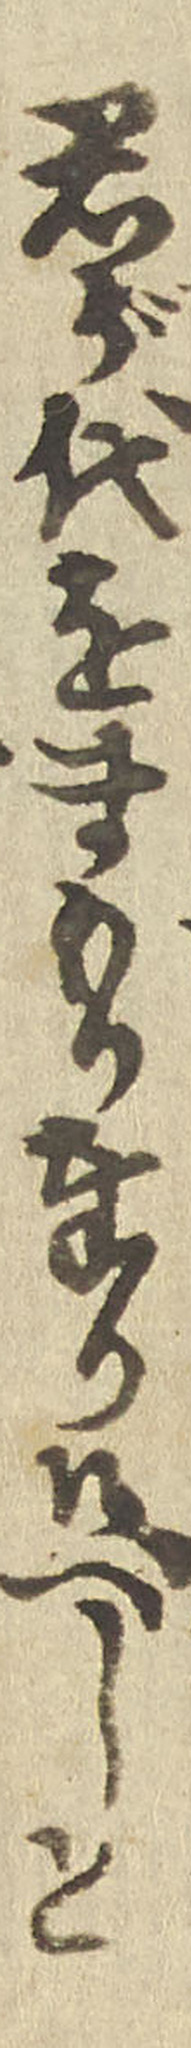君が代をまもり奉り候べしと
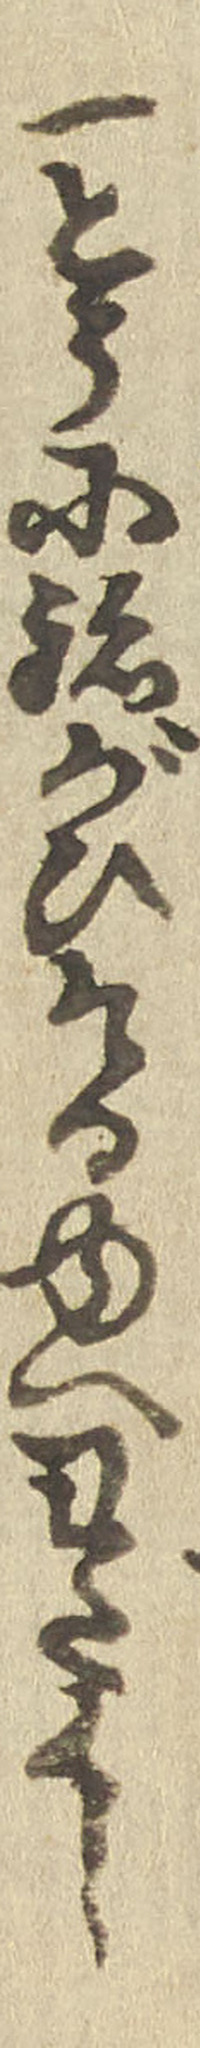一とうにねがひけるゆへわたくし
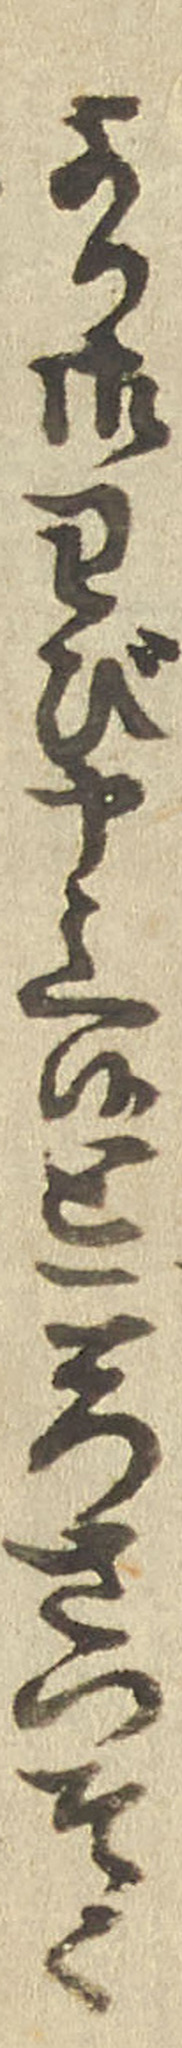より御わび申上候ところさつそく
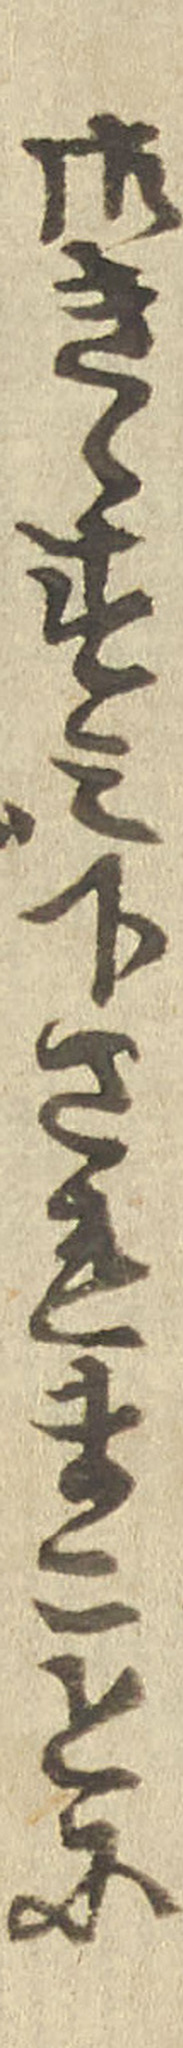御きゝすみ下されまことに
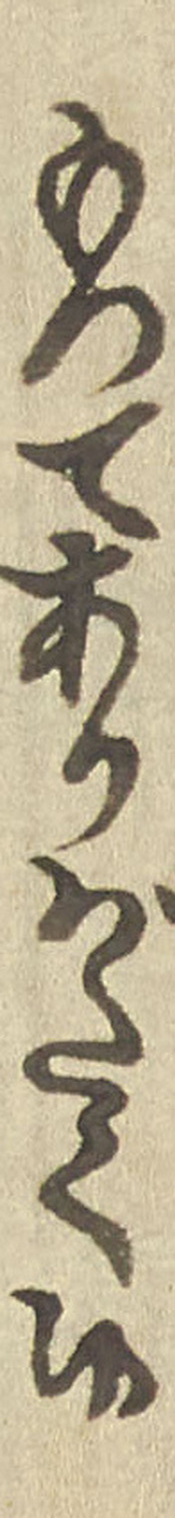もつてありがたく候
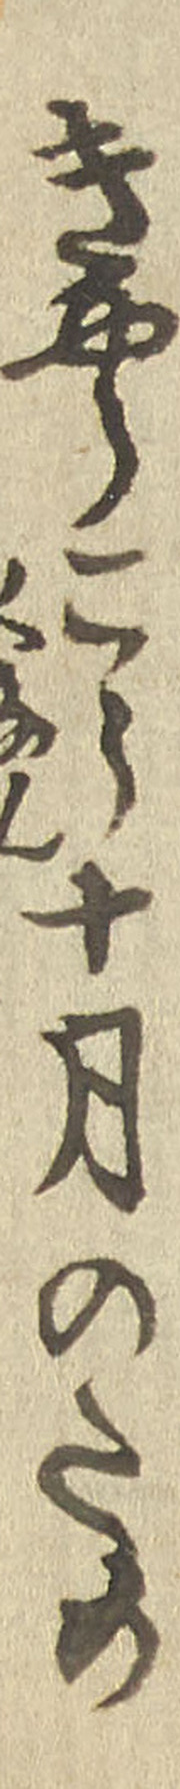きやうこう十月のため
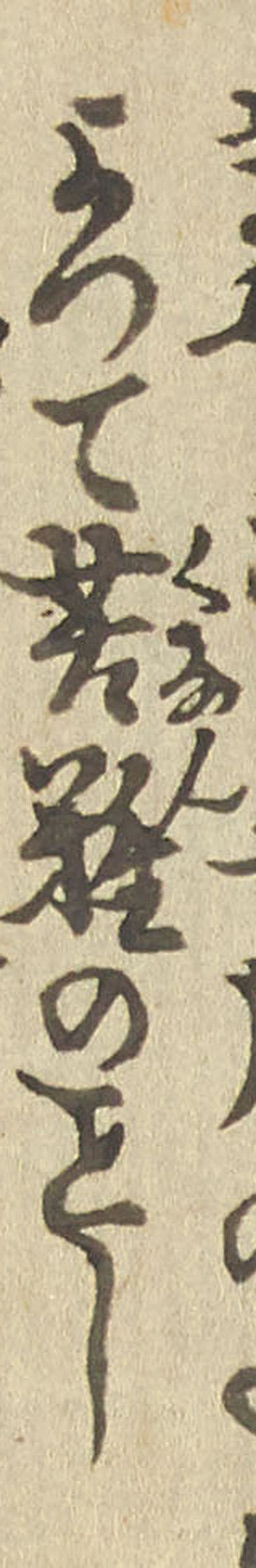よつて苦難のことし
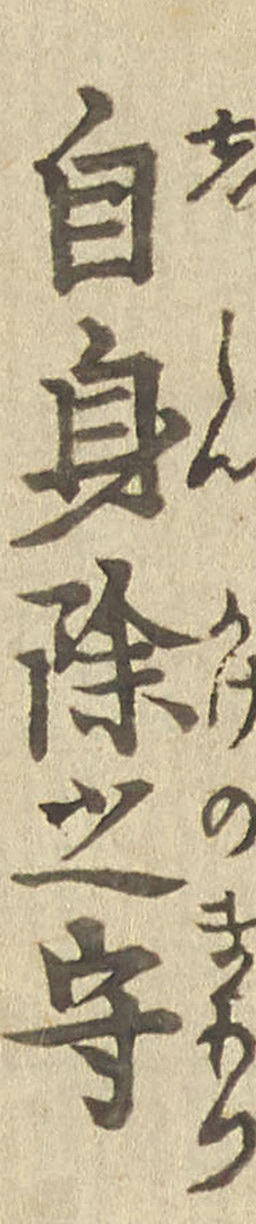自身除之守
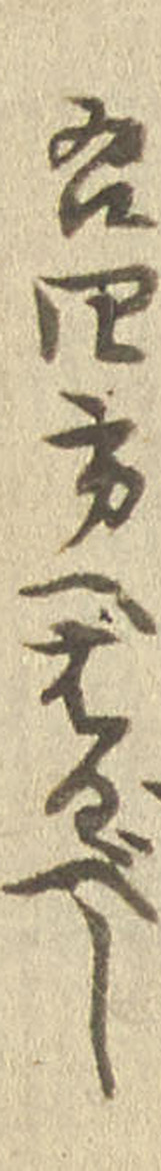各四方へはるべし
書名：恵比寿天申訳之記
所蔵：東京大学総合図書館 General Library in the University of Tokyo, JAPAN
